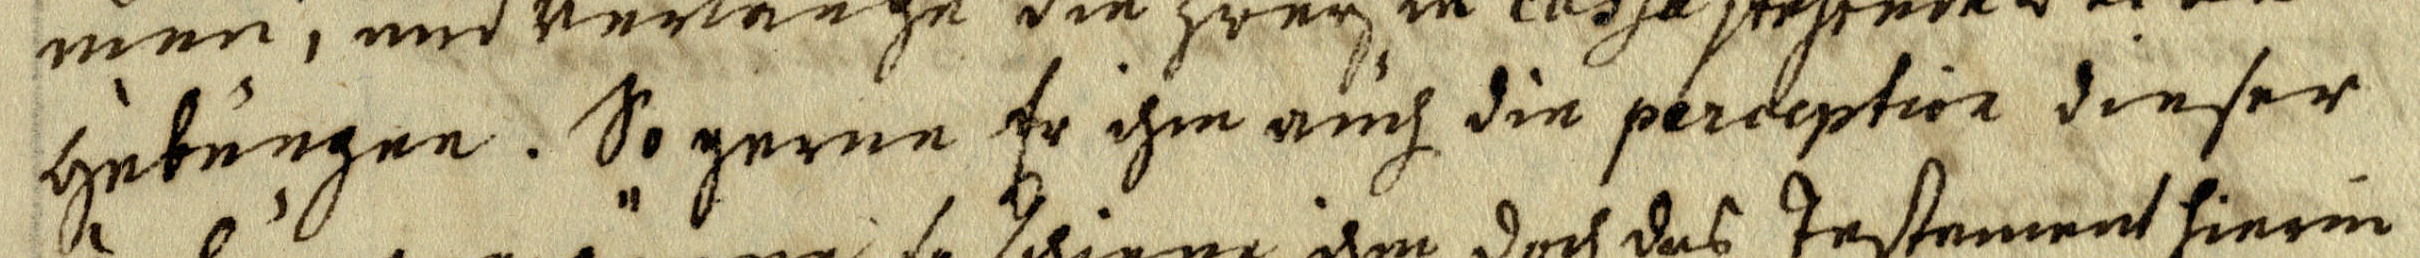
Hebungen. So gerne Er ihm auch die perception dieser
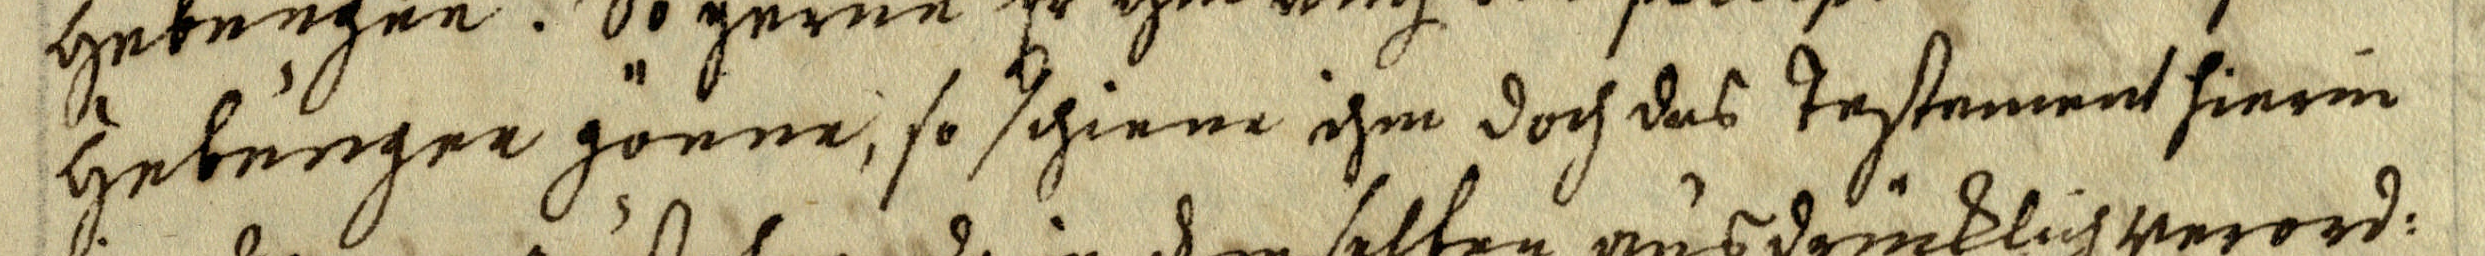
Hebungen gönne, so schien ihm doch das Testament hierin
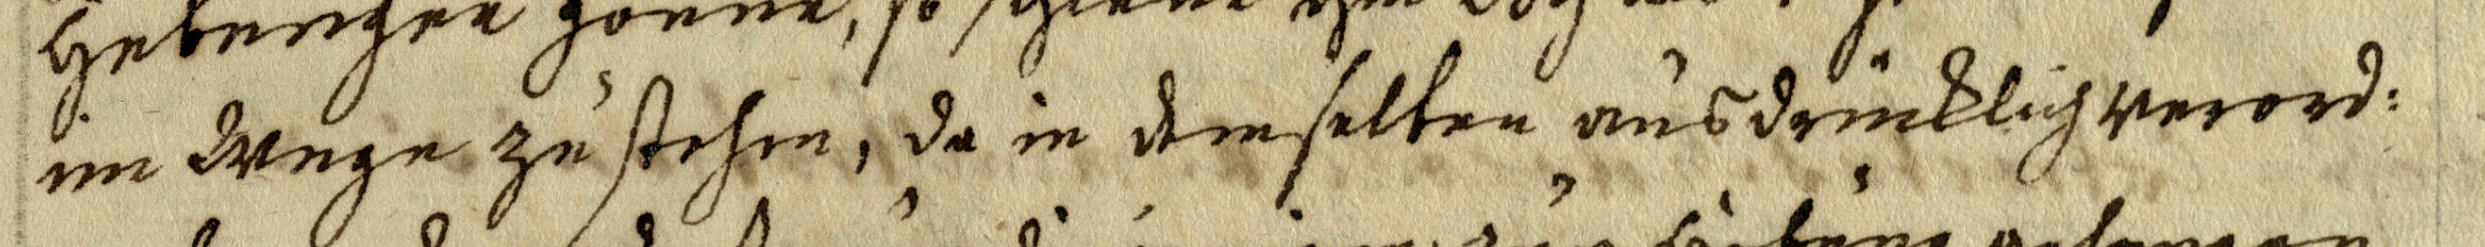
im Wege zu stehen, da in demselben ausdrücklich verord¬
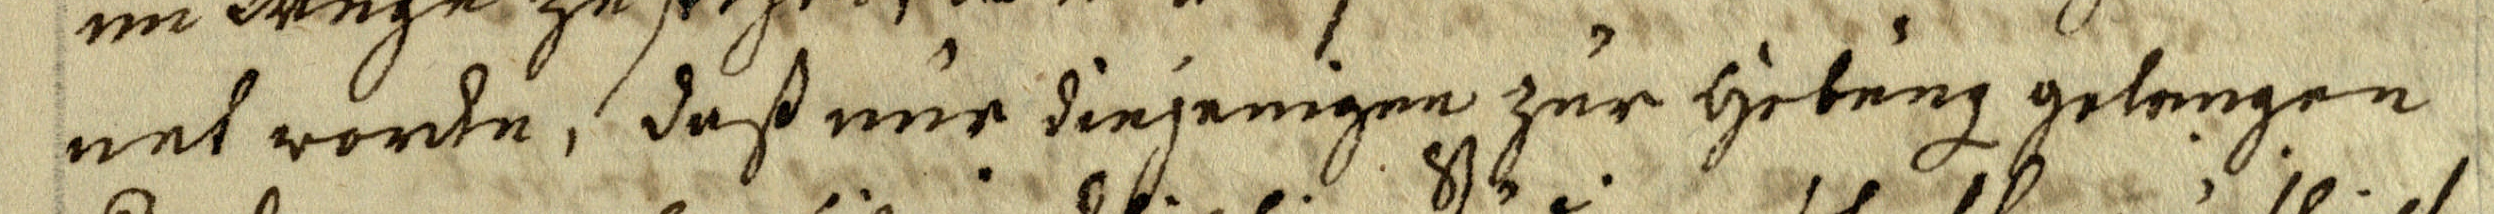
net worden, daß nur diejenigen zur Hebung gelangen
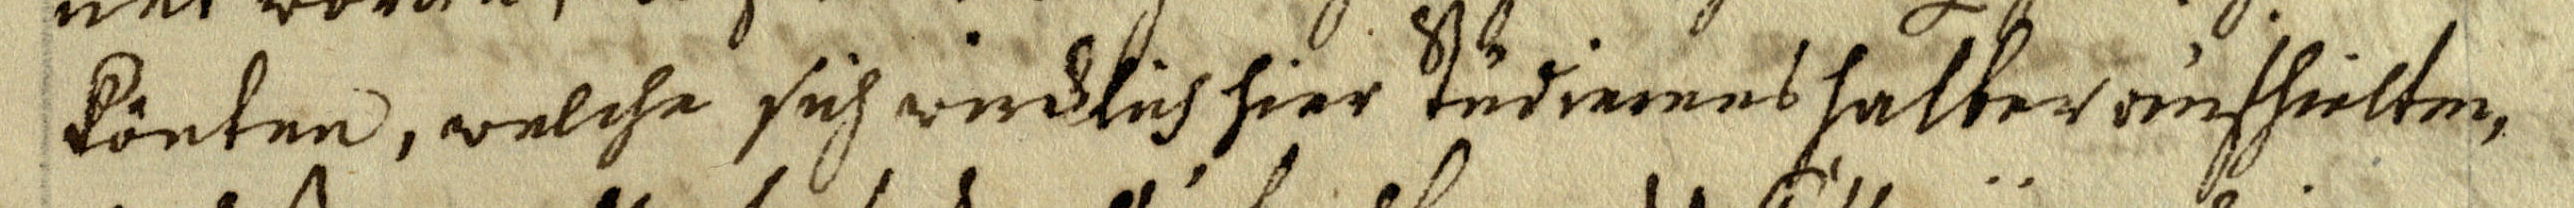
könten, welche sich wircklich hier Studierens halber aufhielten,
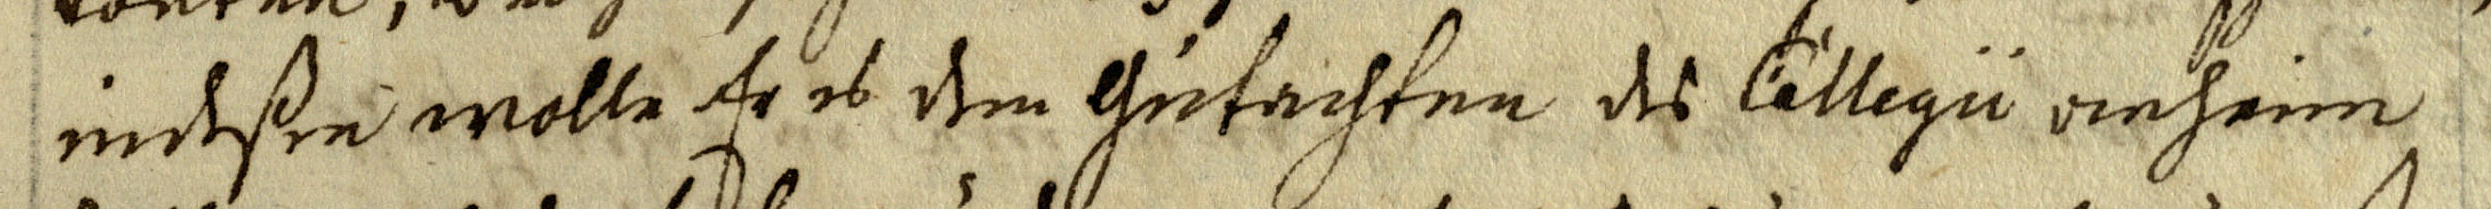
indeßen wolle Er es dem Gutachten des Collegii anheim
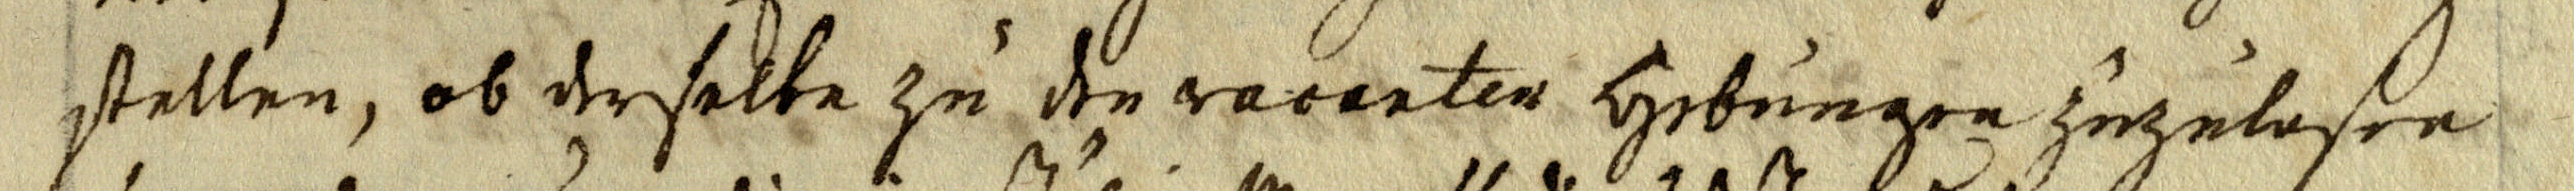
stellen, ob derselbe zu den vacanten Hebungen zuzulaßen
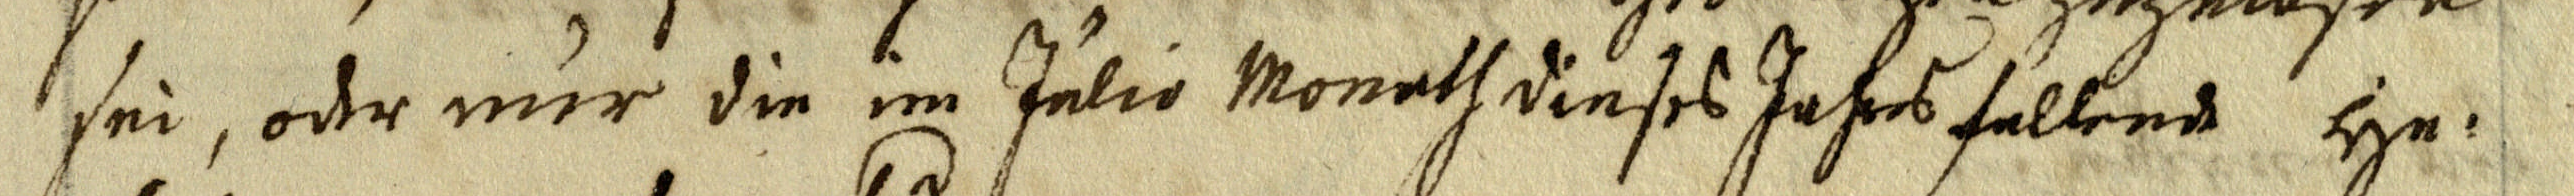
sei, oder nur die im Julio Monath diese Jahres fallende He¬
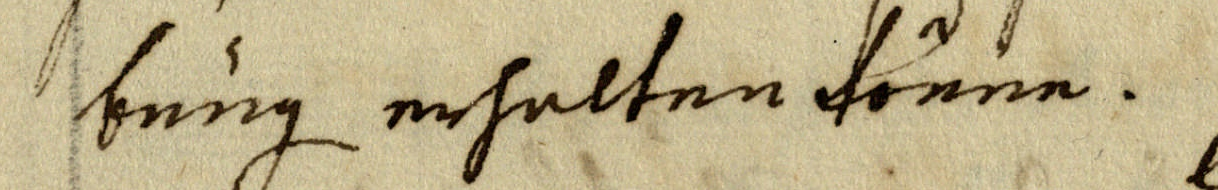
bung erhalten könne.
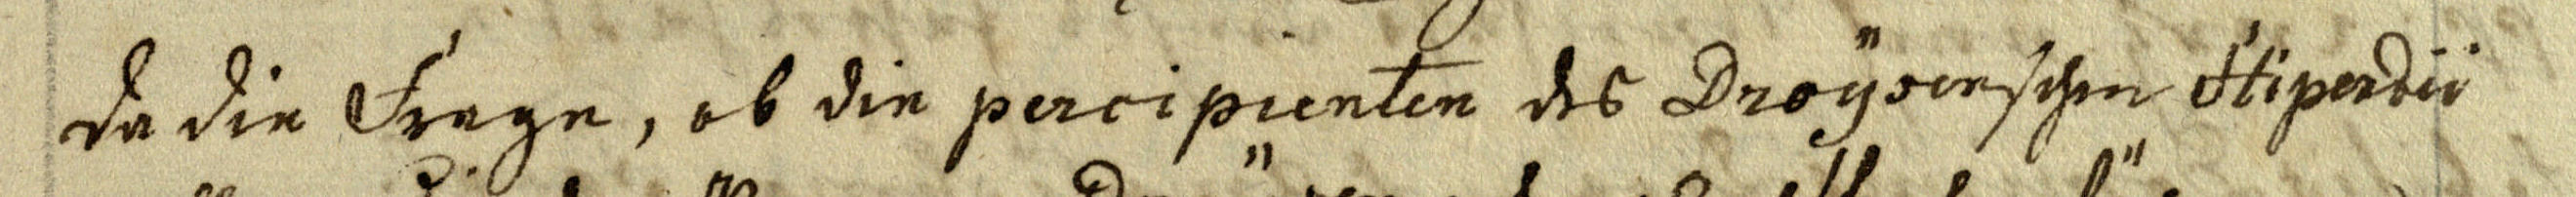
Da die Frage, ob die percipienten des Droÿsenschen Stipendii
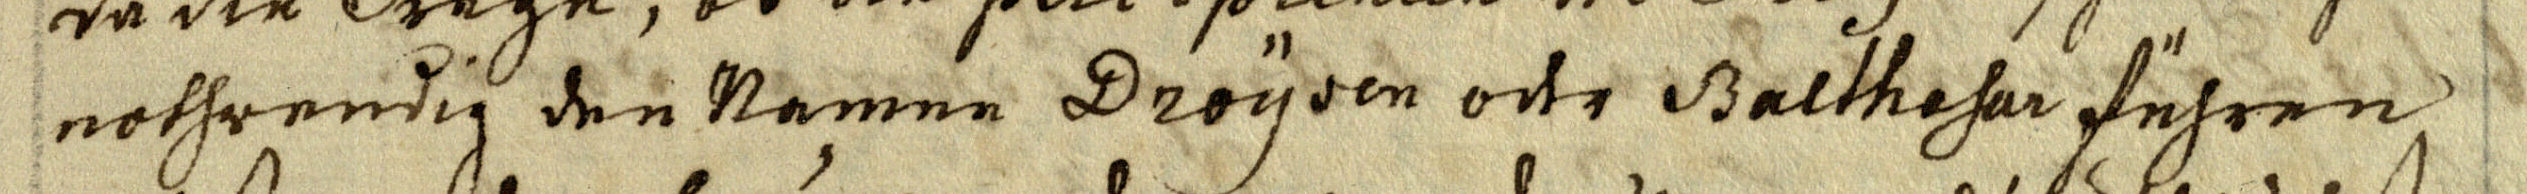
nothwendig den Namen Droÿsen oder Balthasar führen
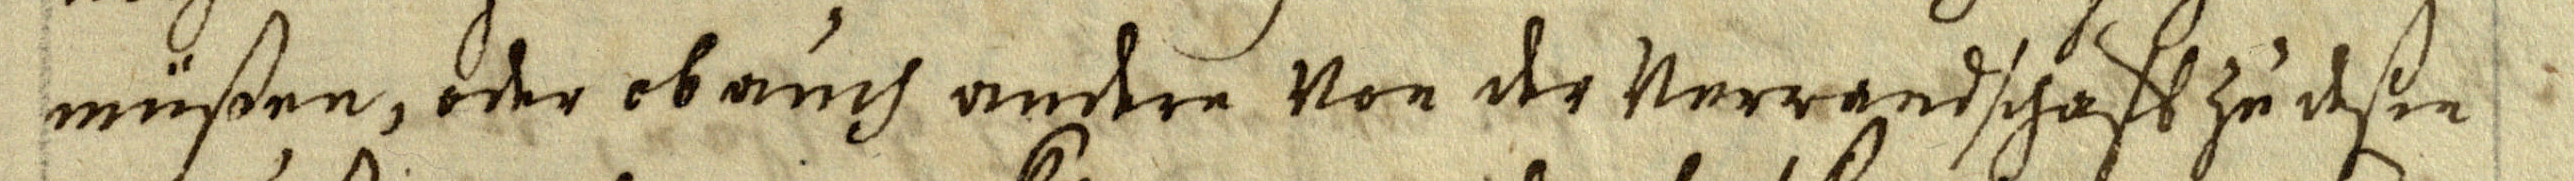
müßen, oder ob auch andere von der Verwandschaft zu deßen
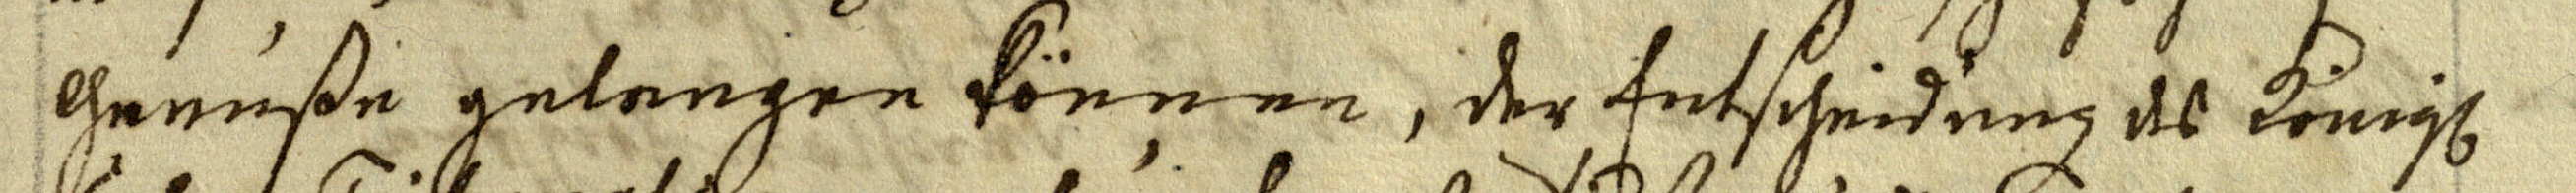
Genuße gelangen können, der Entscheidung des Königl.
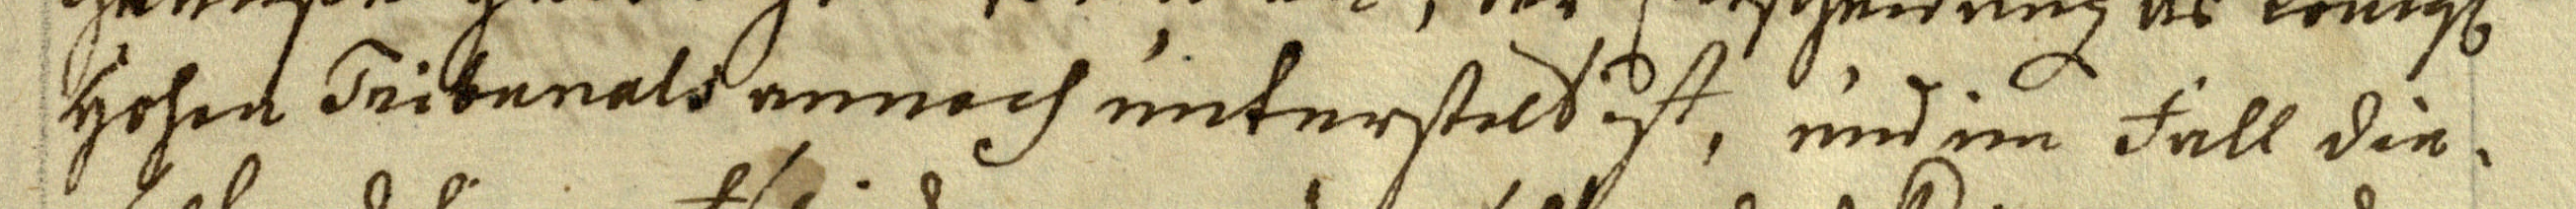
Hohen Tribunals annoch unterstelt ist, und im Fall die¬
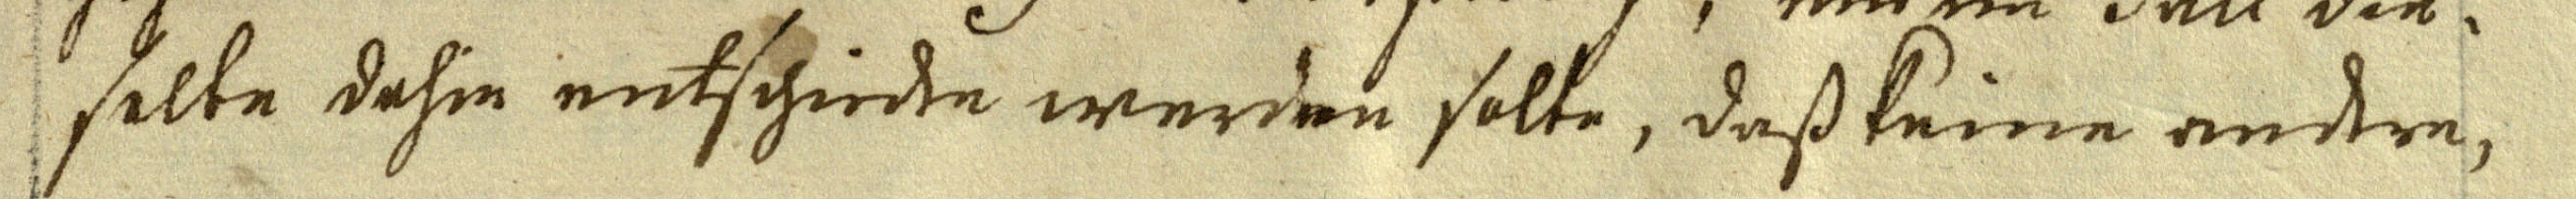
selbe dahin entschieden werden solte, daß keine andern,
